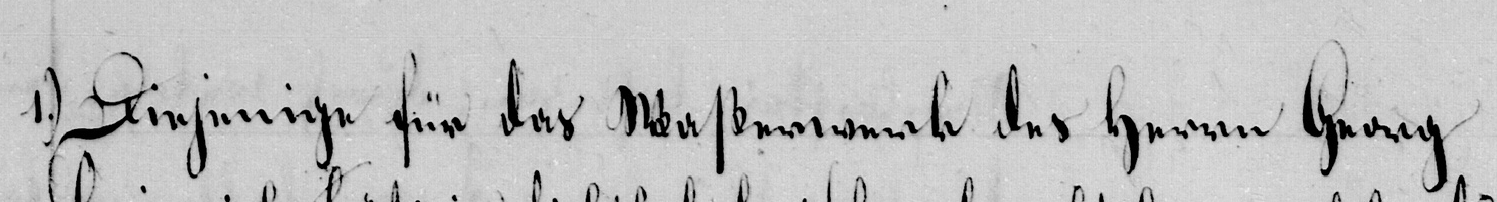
1.) Diejenige für das Waßerwerk des Herrn Georg
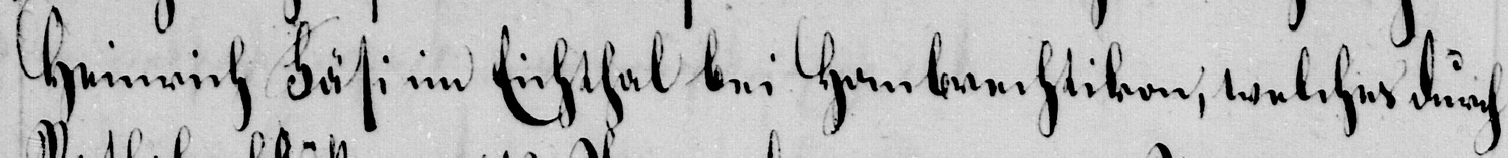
Heinrich Fäsi im Eichthal bei Hombrechtikon, welches durch
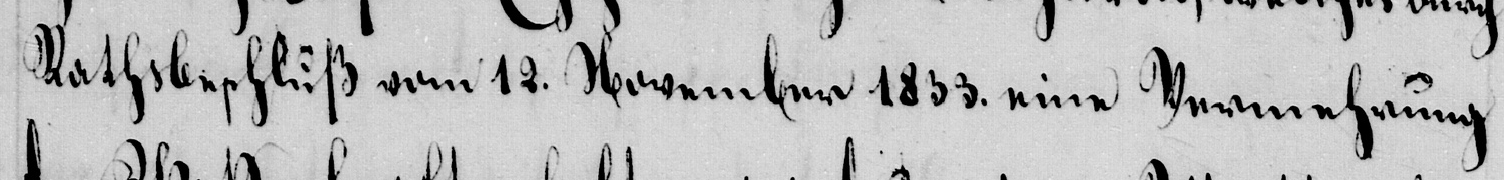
Rathsbeschluß vom 12. November 1833. eine Vermehrung
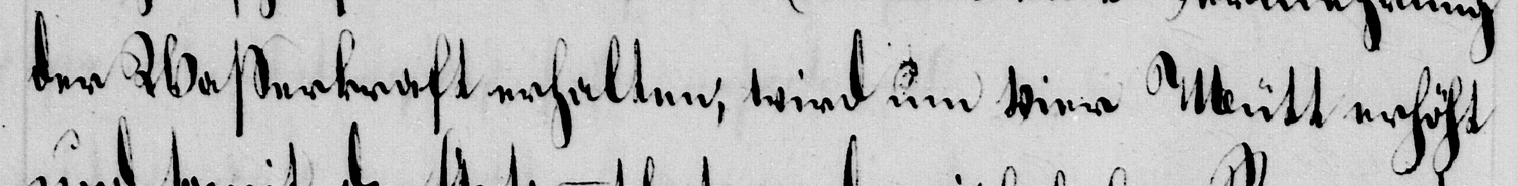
der Waßerkraft erhalten, wird um vier Mütt erhöht
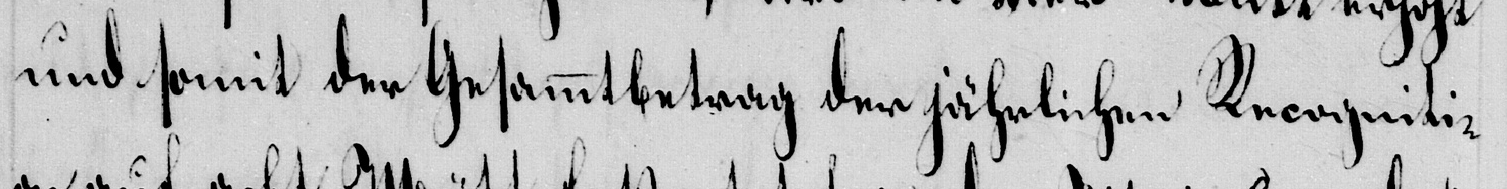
und somit der Gesammtbetrag der jährlichen Recogniti¬
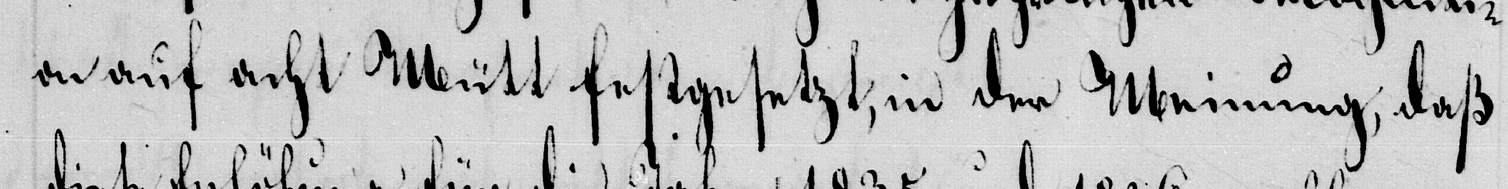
on auf acht Mütt festgesetzt, in der Meinung, daß
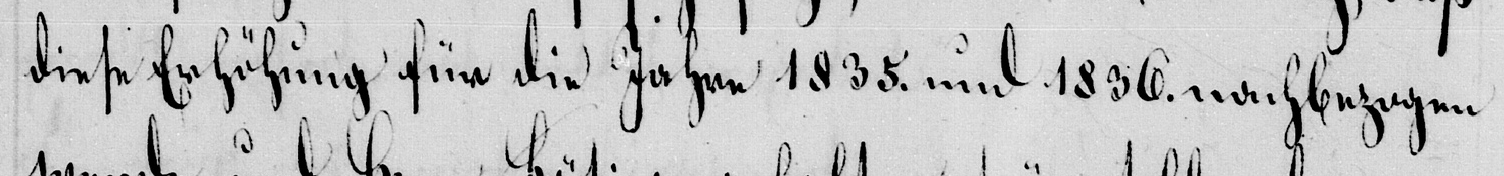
diese Erhöhung für die Jahre 1835. und 1836. nachbezogen
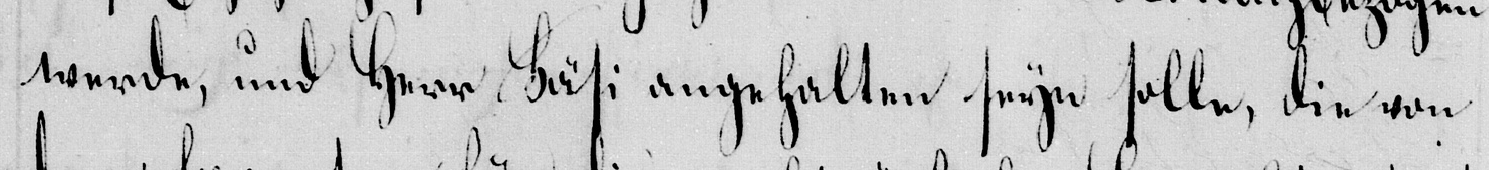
werde, und Herr Fäsi angehalten seyn solle, die von
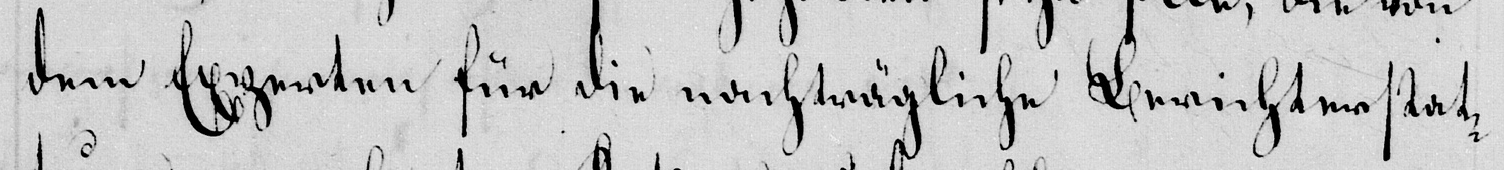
dem Experten für die nachträgliche Berichterstat¬
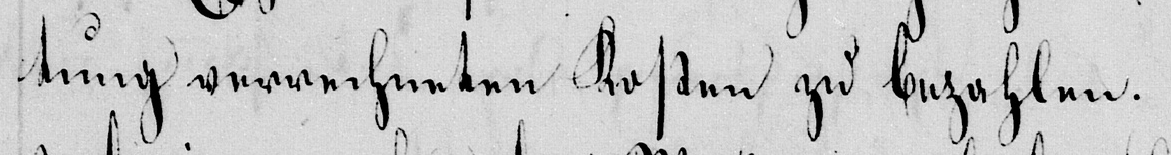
tung verrechneten Kosten zu bezahlen.
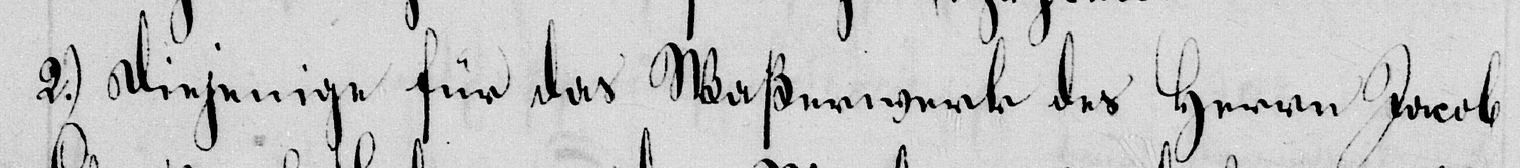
2.) Diejenige für das Waßerwerk des Herrn Jacob
